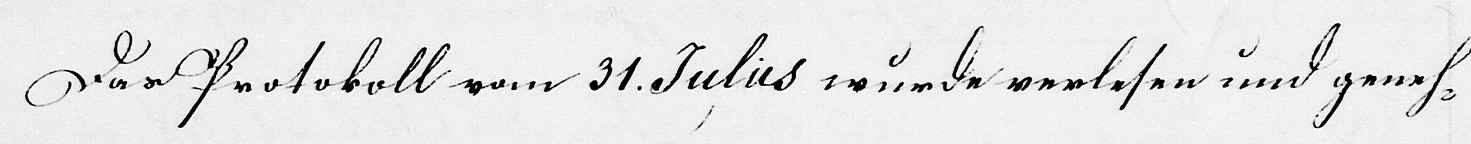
Das Protokoll vom 31. Julus wurde verlesen und geneh¬
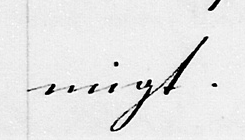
migt.
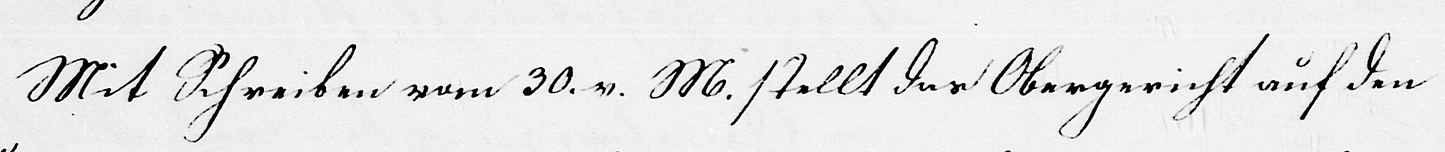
Mit Schreiben vom 30. v. M. stellt das Obergericht auf den
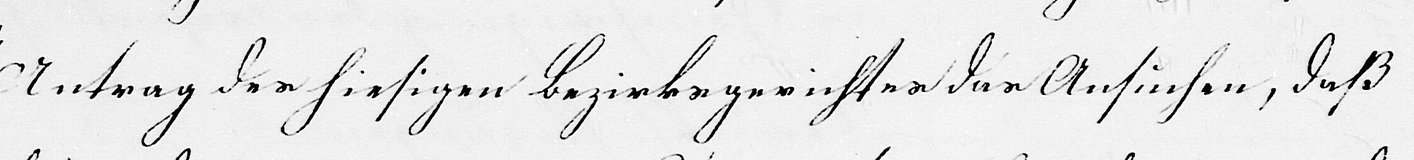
Antrag des hiesigen Bezirksgerichtes das Ansuchen, daß
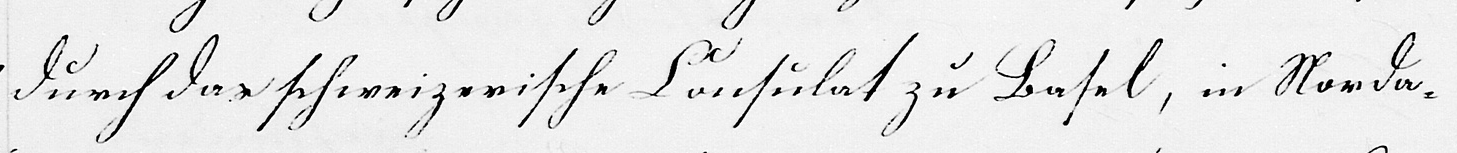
durch das schweizerische Consulat zu Basel, in Norda¬
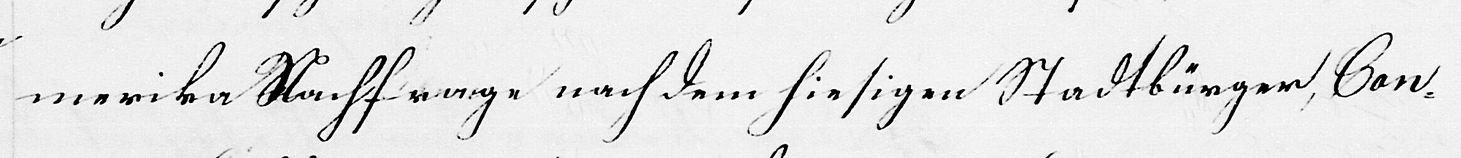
merika Nachfrage nach dem hiesigen Stadtbürger, Con¬
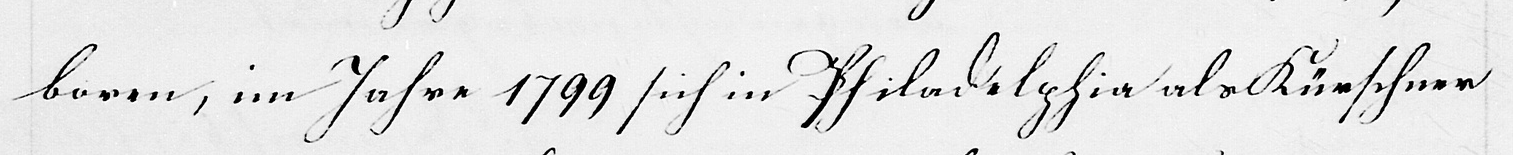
boren, im Jahre 1799 sich in Philadelphia als Kürschner
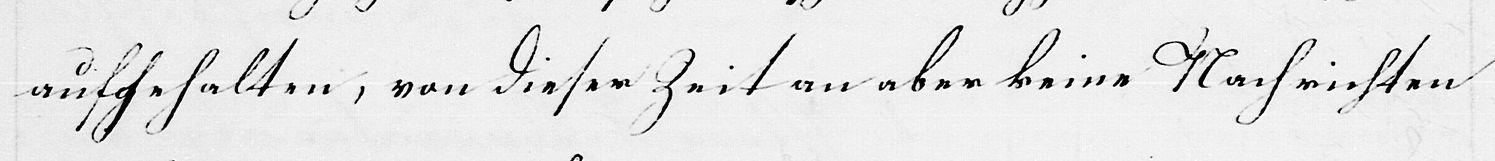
aufgehalten, von dieser Zeit an aber keine Nachrichten
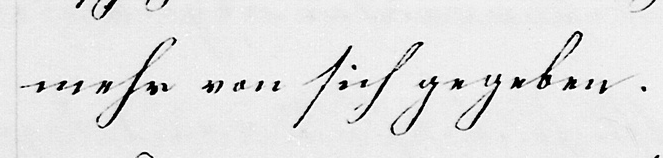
mehr von sich gegeben.
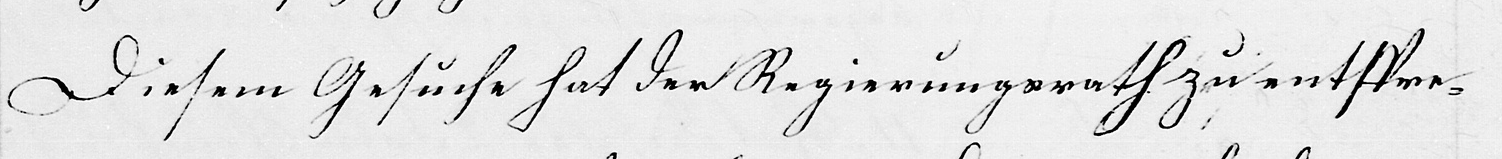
Diesem Gesuch hat der Regierungsrath zu entspre¬
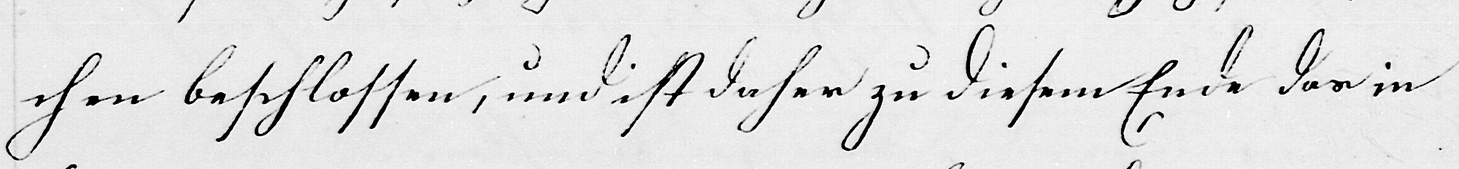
chen beschlossen, und ist daher zu diesem Ende das in
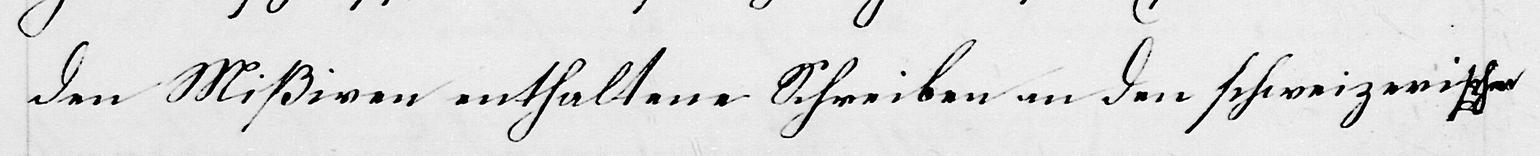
den Mißiven enthaltene Schreiben an den schweizerischen
